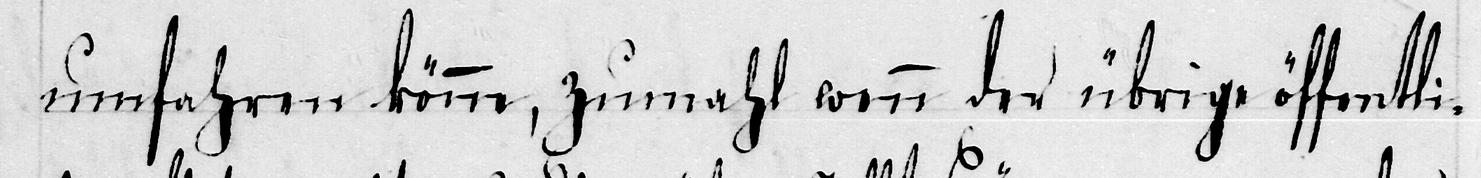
umfahren könne, zumahl wenn der übrige öffentl¬
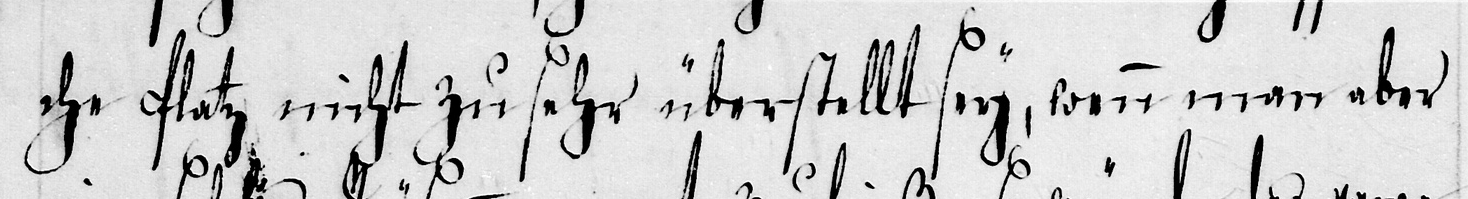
iche Platz nicht zu sehr überstellt sey, wenn man aber
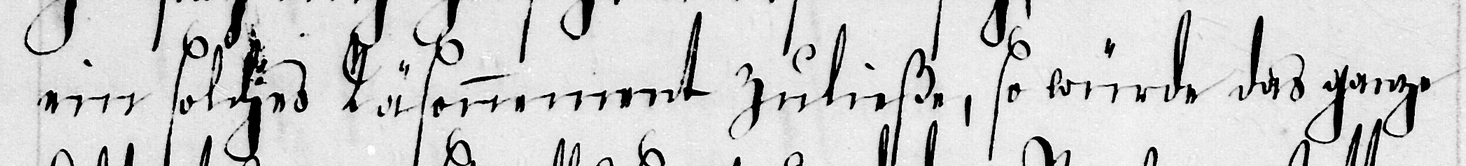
ein solches Räsonnement zuließe, so würde das ganze
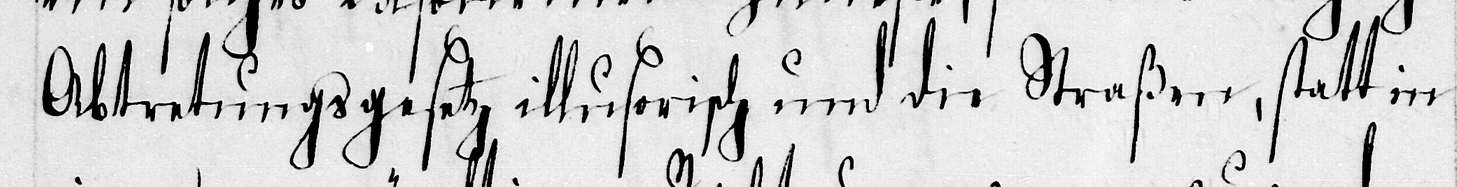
Abtretungsgesetz illusorisch und die Straßen, statt in
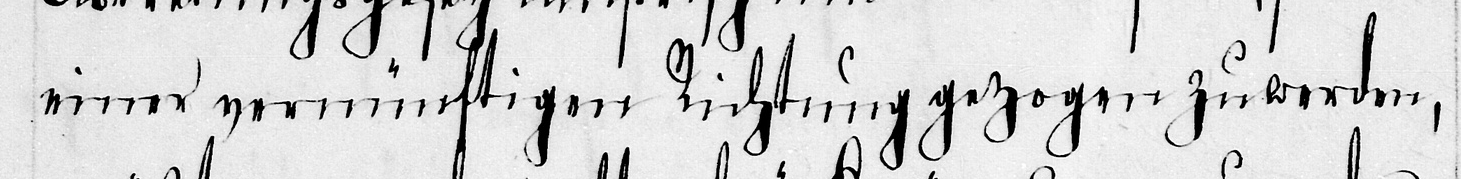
einer vernünftigen Richtung gezogen zu werden,
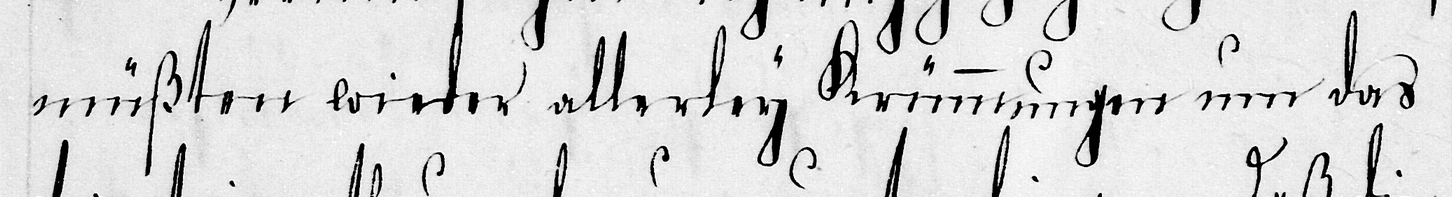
müßten wieder allerley Krümmungen um das
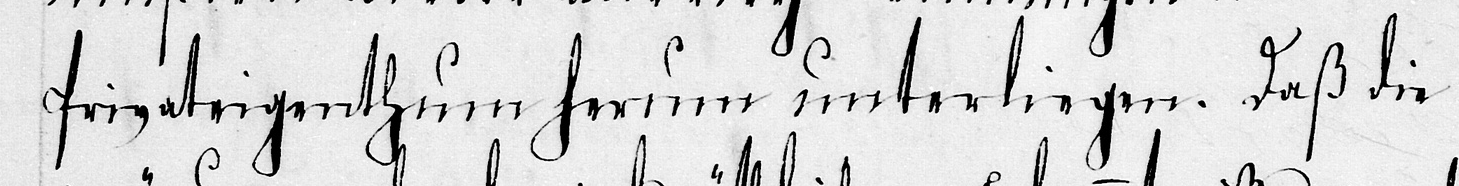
Privateigenthum herum unterliegen. Daß die
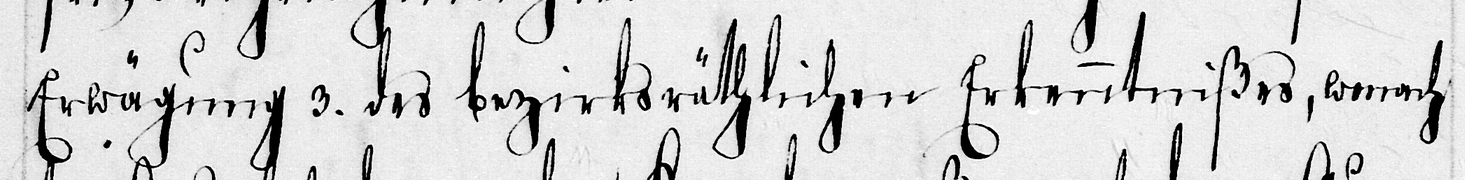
Erwägung 3. des bezirksräthlichen Erkenntnißes, wonach
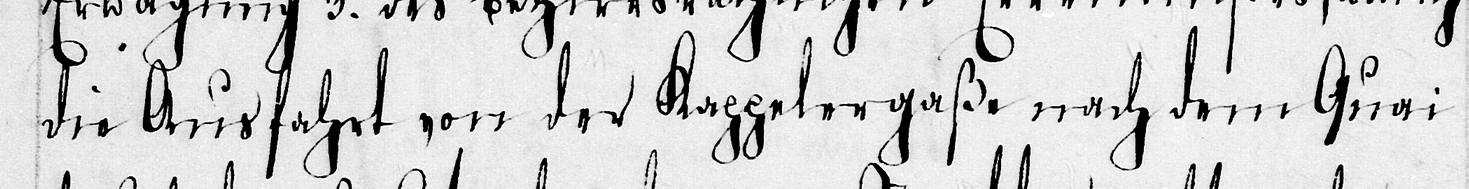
die Ausfahrt von der Kappelergaße nach dem Quai
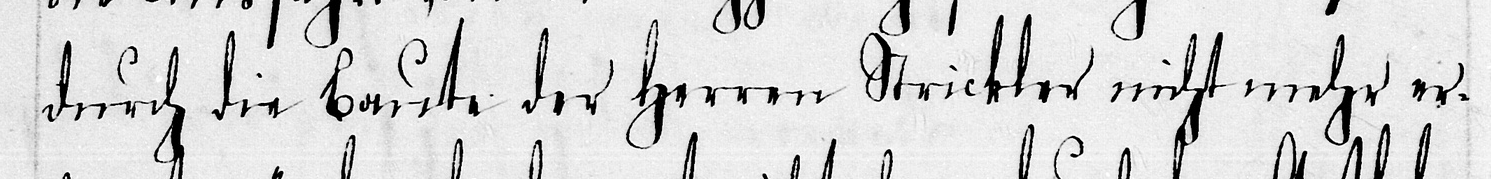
durch die Baute der Herren Strickler nicht mehr er¬
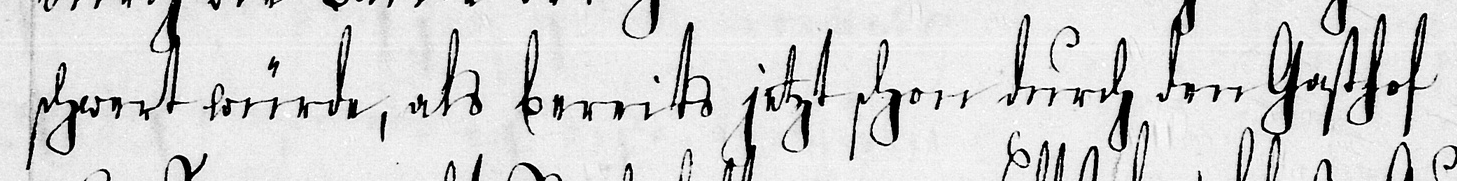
schwert würde, als bereits jetzt schon durch den Gasthof
